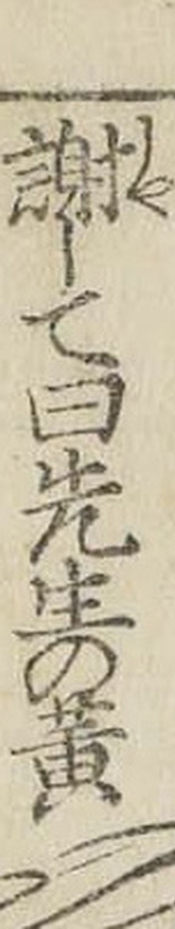謝して曰先生の黄
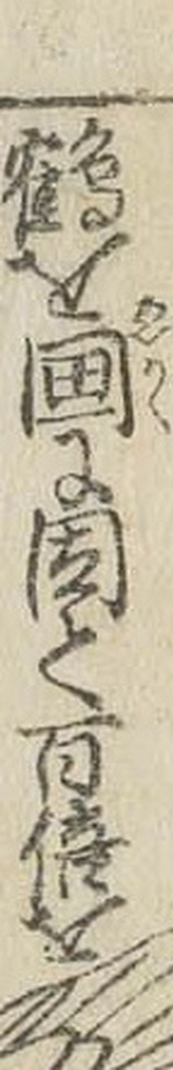鶴を画に因て百倍を
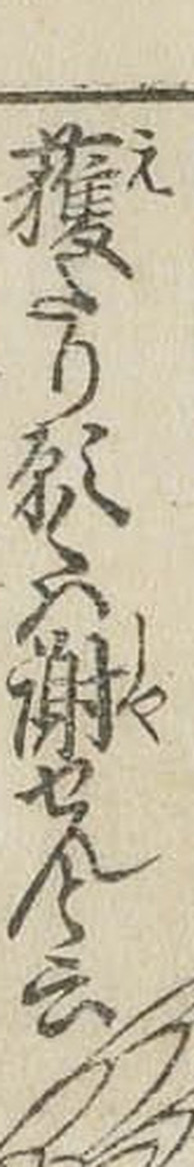獲たり願くは謝せんと云
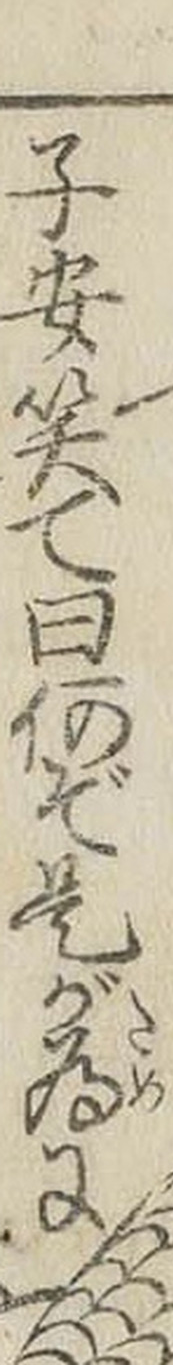子安笑て曰何ぞ是が為に
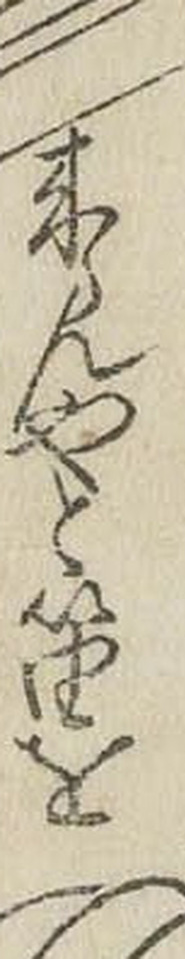来らんやと笛を
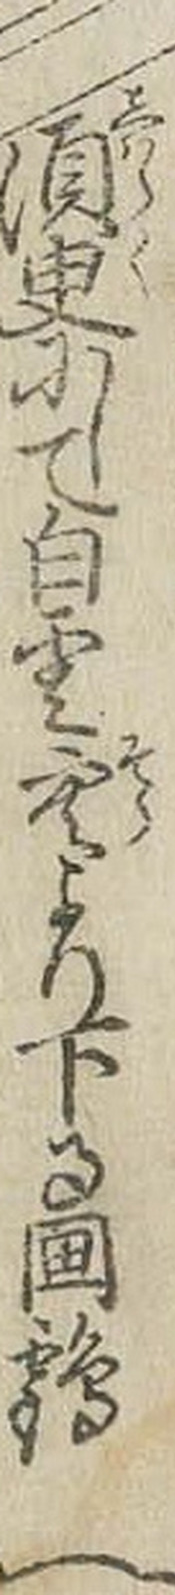須臾にして白雪空より下る画鶴
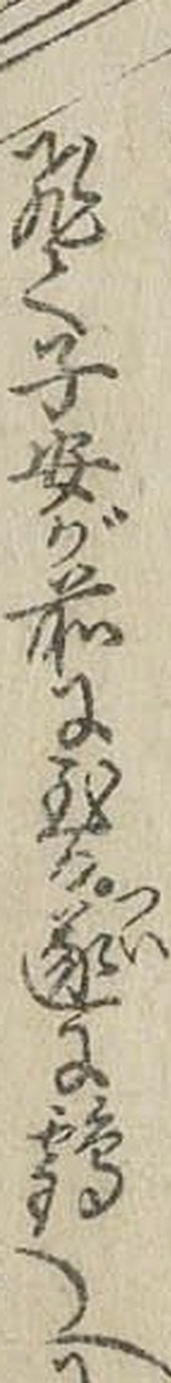飛て子安が前に至る。遂に鶴に跨り雲
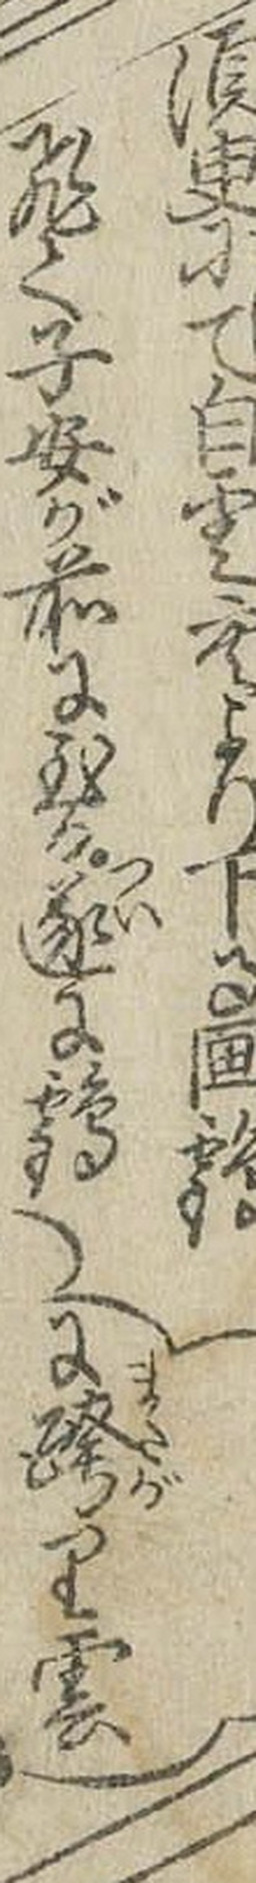飛て子安が前に至る。遂に鶴に跨り雲
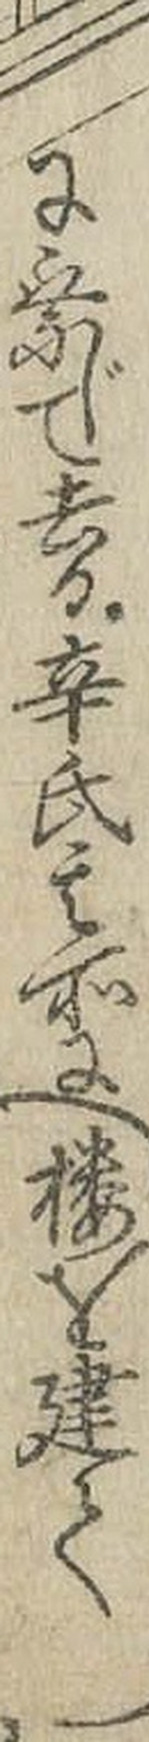に乗じて去る。辛氏其所に楼を建て
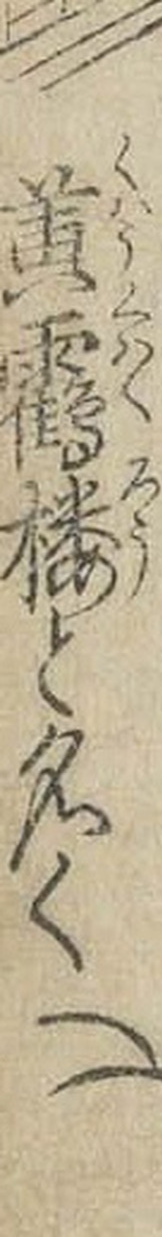黄鶴楼と名く

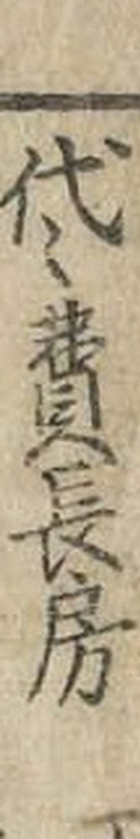代々費長房
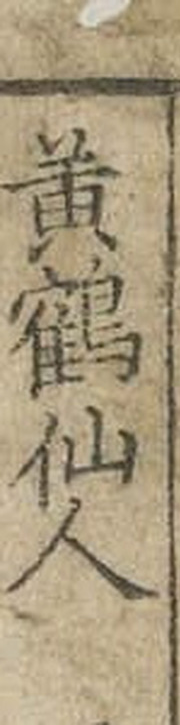黄鶴仙人
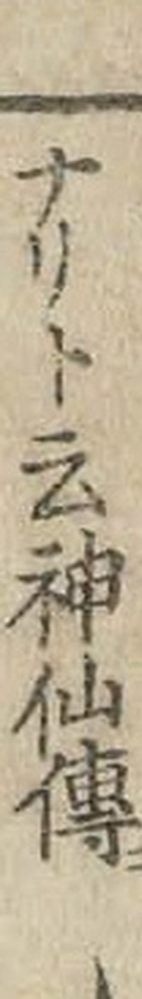ナリト云神仙伝
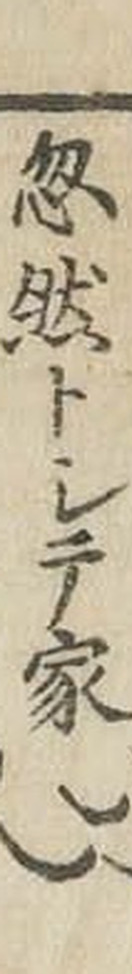忽然トシテ家
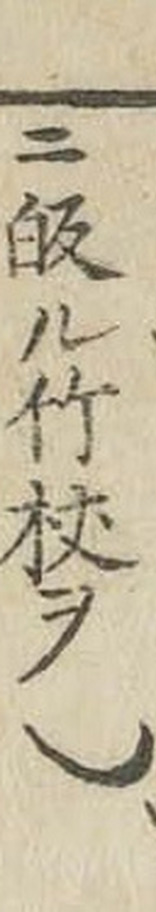ニ皈ル竹杖ヲ
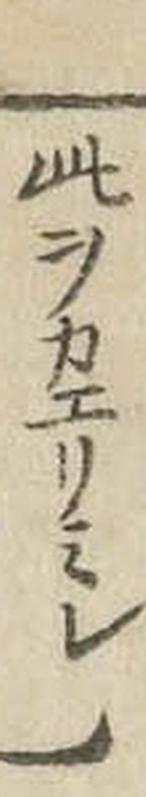此ヲカエリミレ
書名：絵本写宝袋 9巻 7之巻
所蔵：東京学芸大学教育コンテンツアーカイブ
